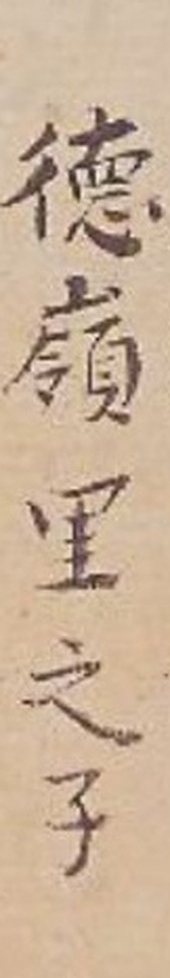徳嶺里之子
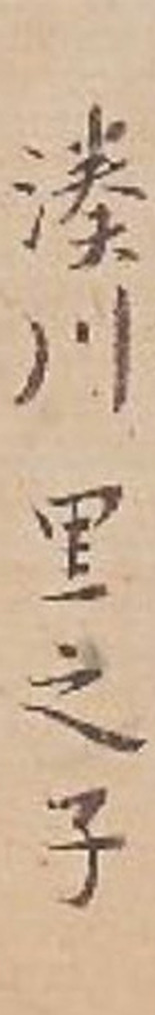湊川里之子
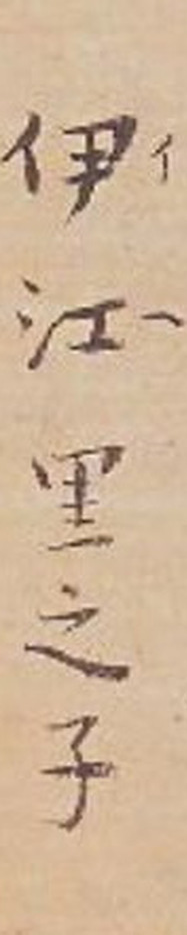伊江里之子
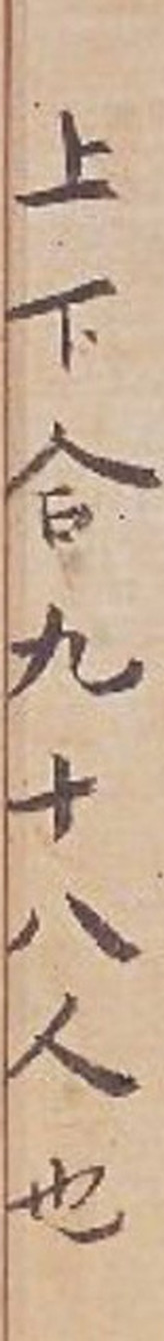上下合九十八人也
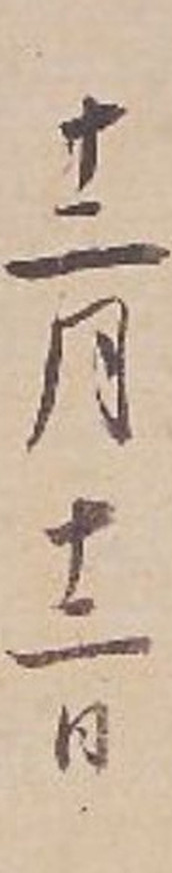十二月十二日
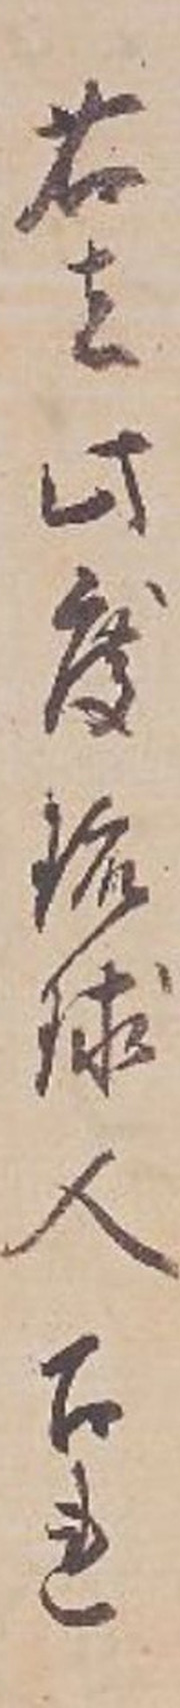右者此度琉球人召連
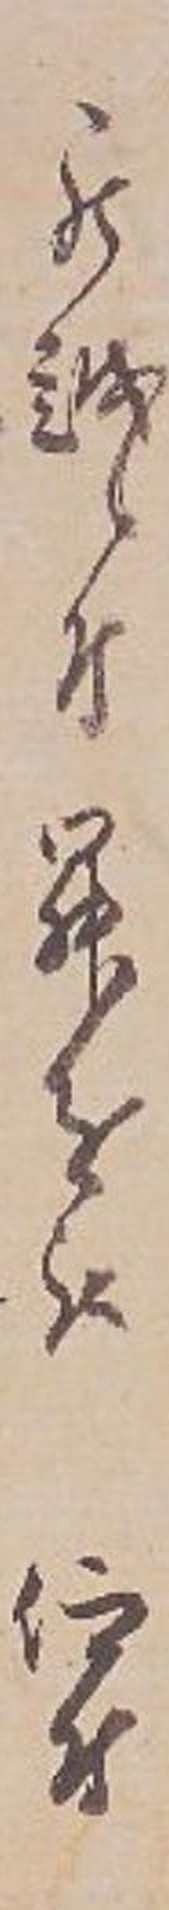罷越候付昇進被仰付
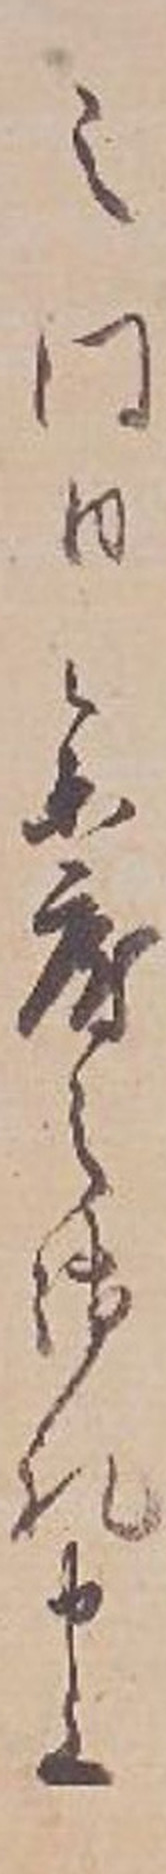之同日参府之御礼申上

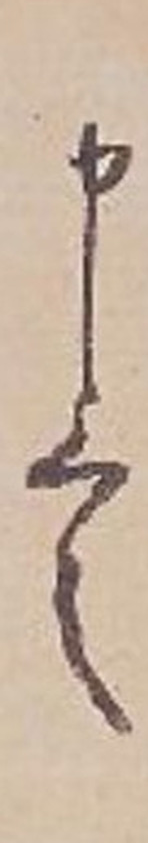申上也
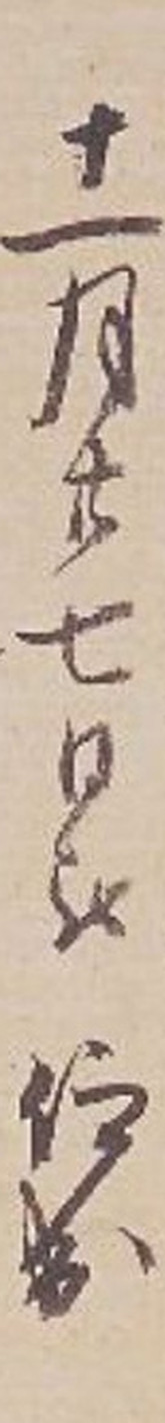十一月廿七日被仰出
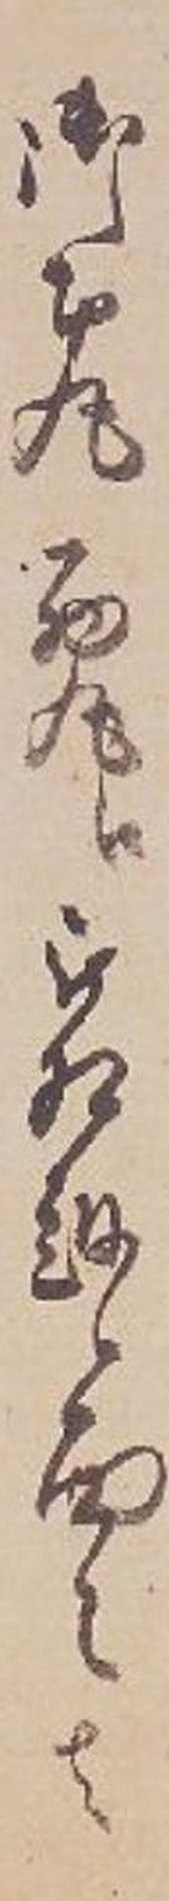御本丸西丸江被相越候面々者
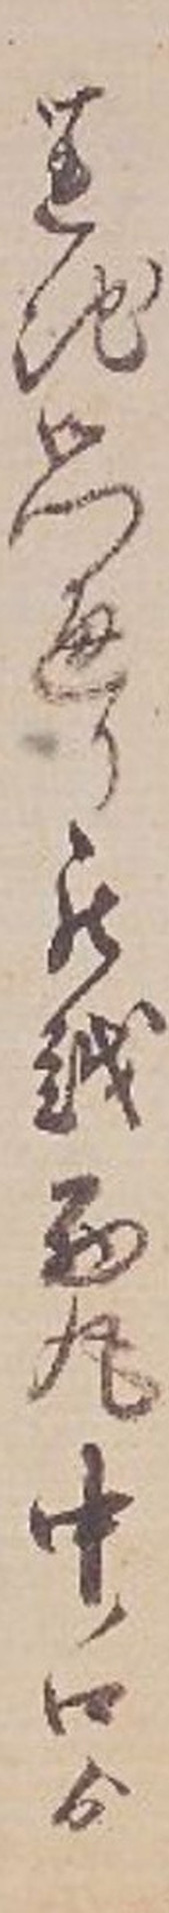蓮池御門通り罷越西丸中ノ口ゟ
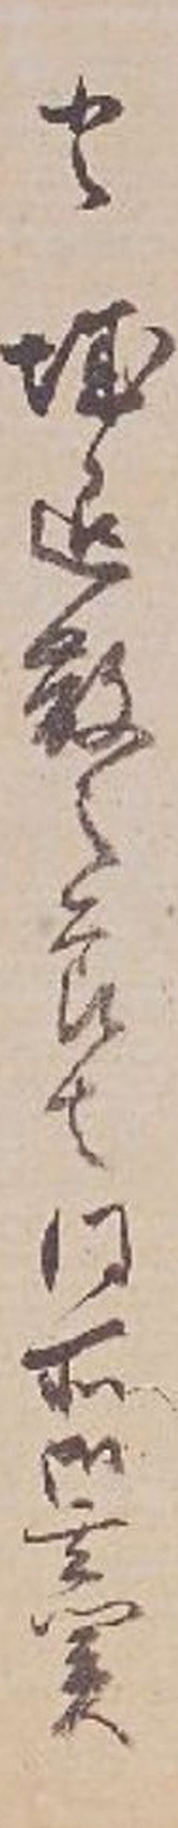登城退散之節者同所御玄関
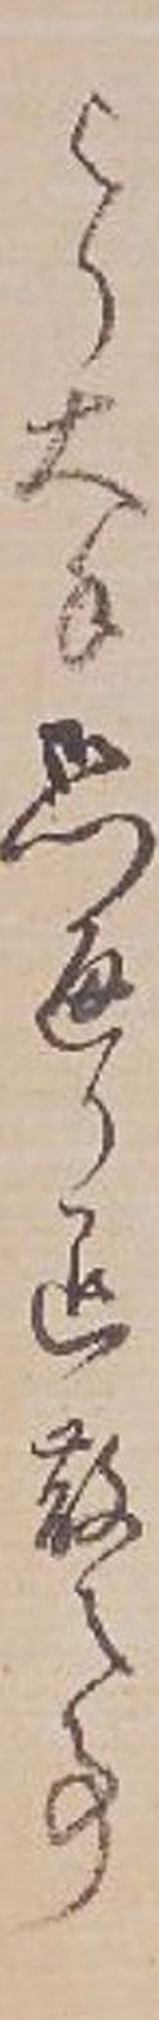上り大手御門通り退散之事

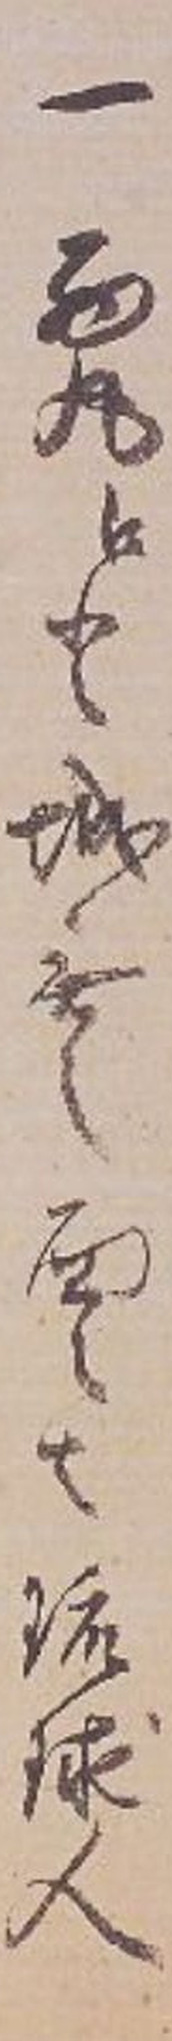一西丸え登城無之面々者琉球人
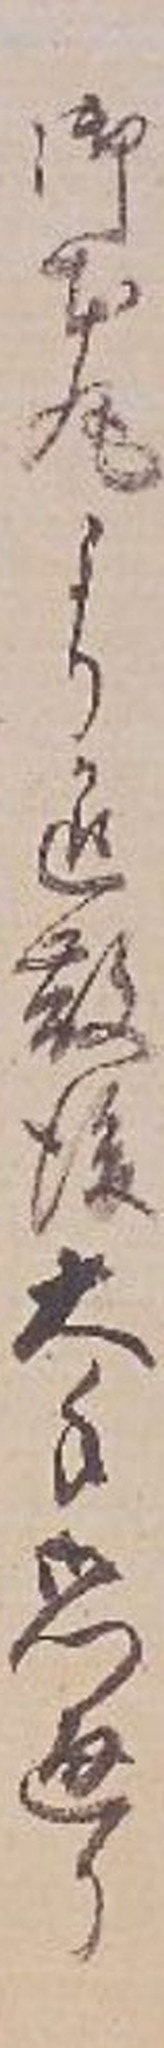御本丸より退散後大手御門通り
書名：琉球人来朝記 一、二
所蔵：University of the Ryukyus Library
